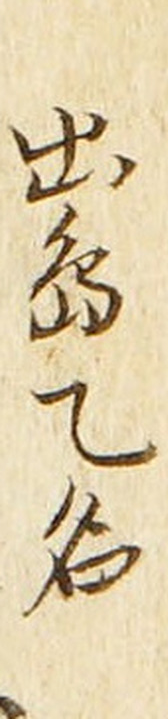出島乙名
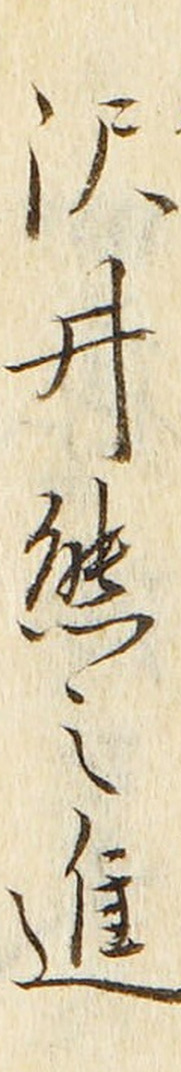沢井熊之進
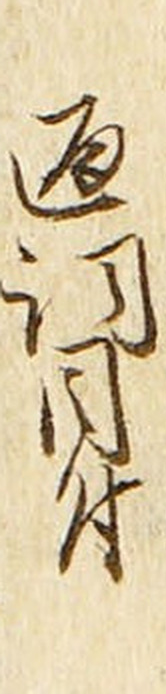通詞目付
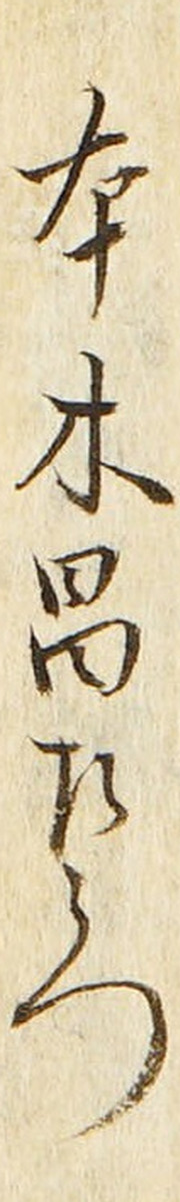本木昌左衛門
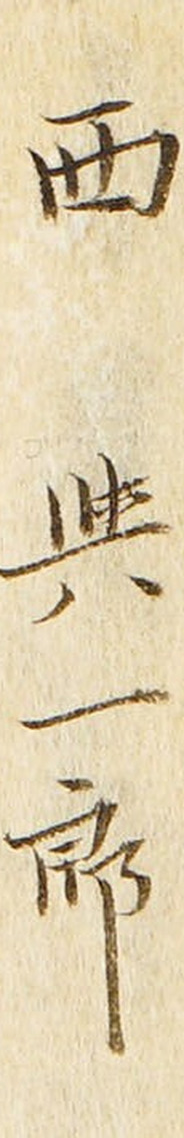西与一郎
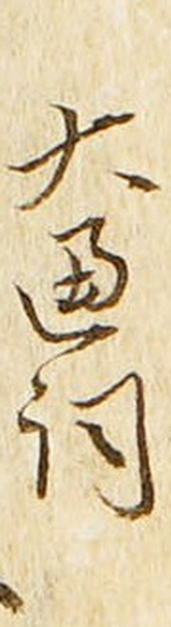大通詞
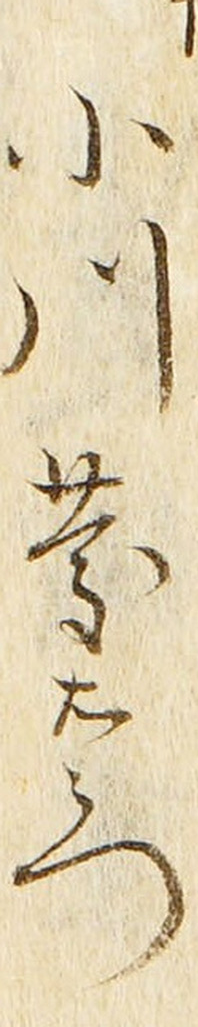小川蒙右衛門
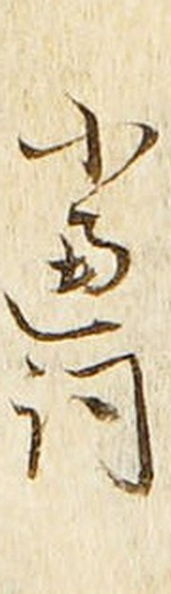小通詞
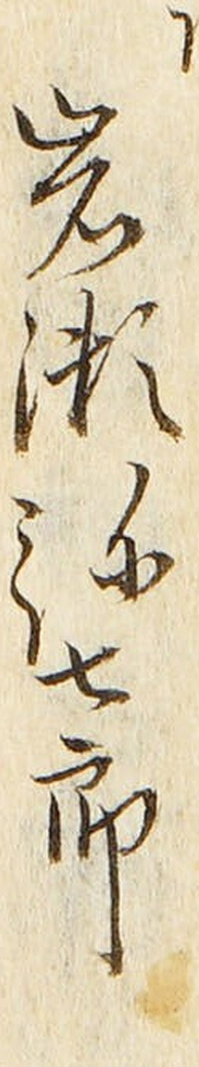岩瀬弥七郎
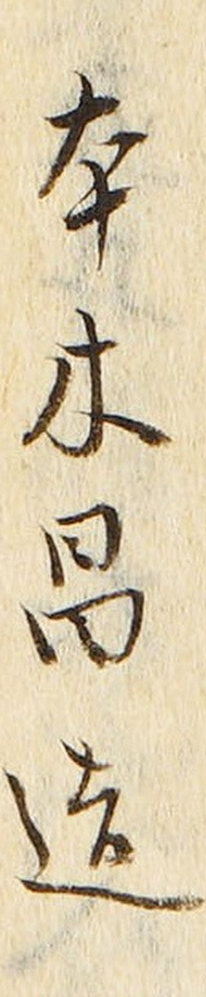本木昌道
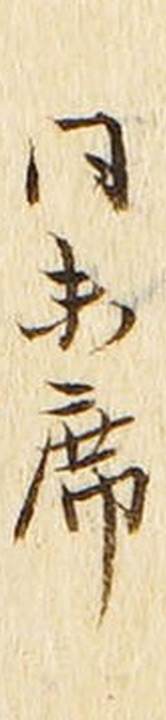同末席
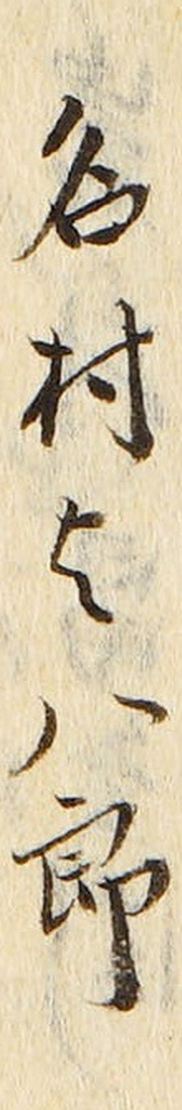名村与八郎
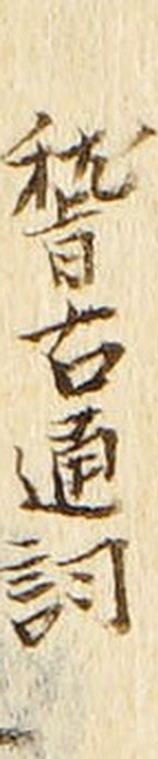稽古通詞
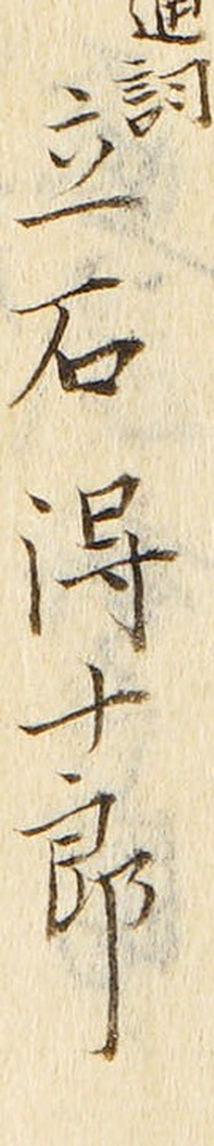立石得十郎
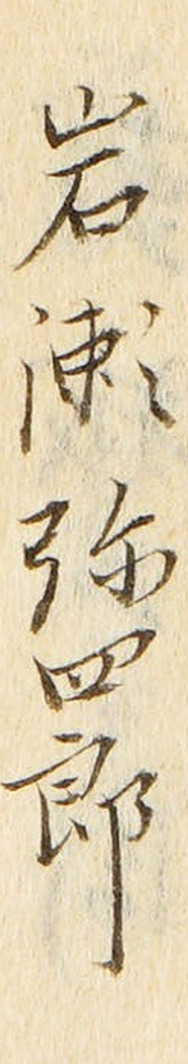岩瀬弥四郎
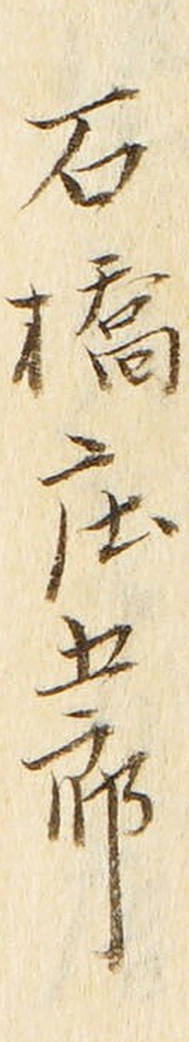石橋庄五郎
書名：長崎漂流記
